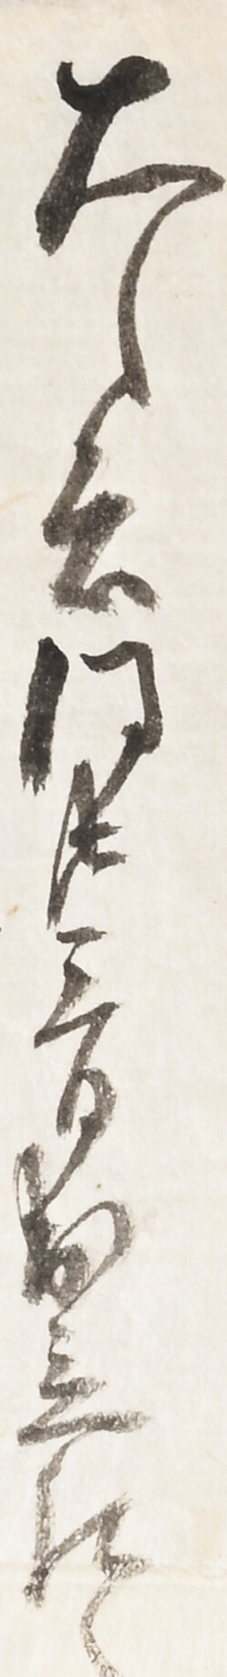右之者同廿三日出立仕候
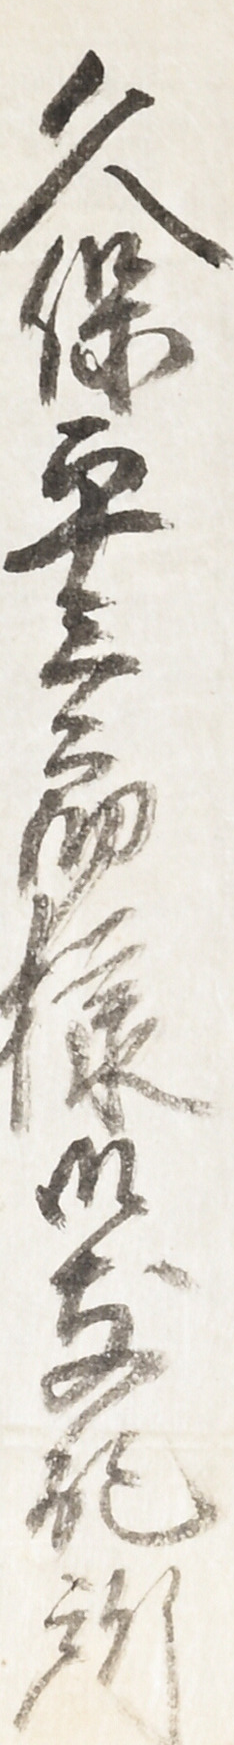久保平三郎様御支配所
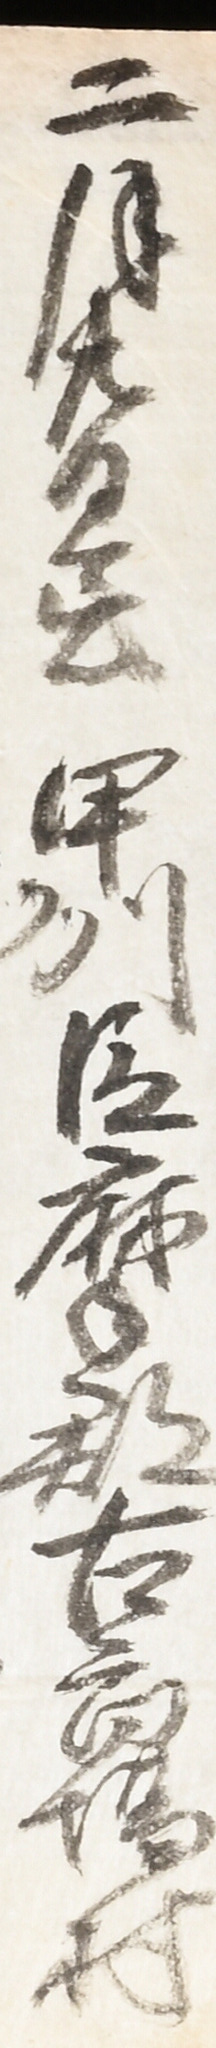二月廿日着甲州巨摩郡古市場村
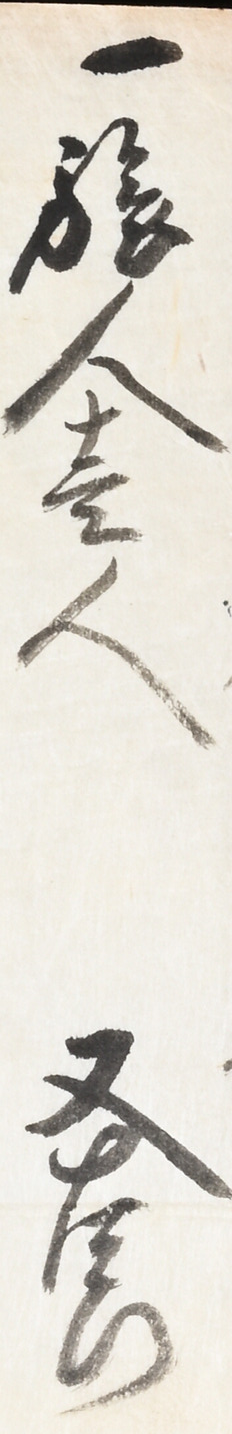一旅人壱人又右衛門
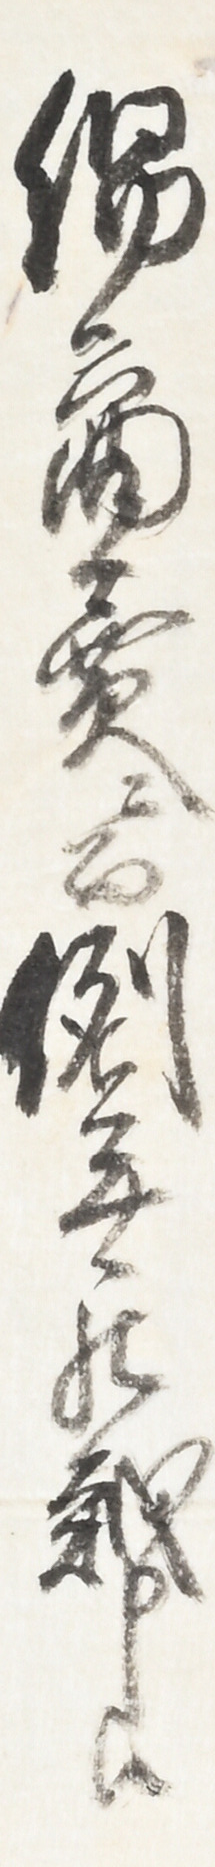紗服商売ニ而例年罷越申候
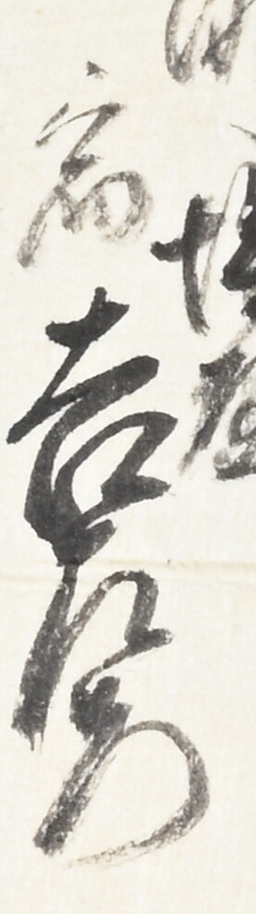宿吉左衛門
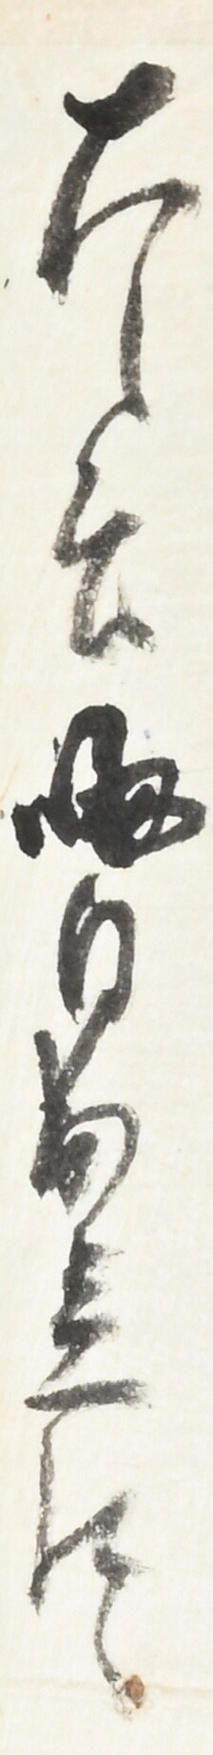右之者晦日出立仕候
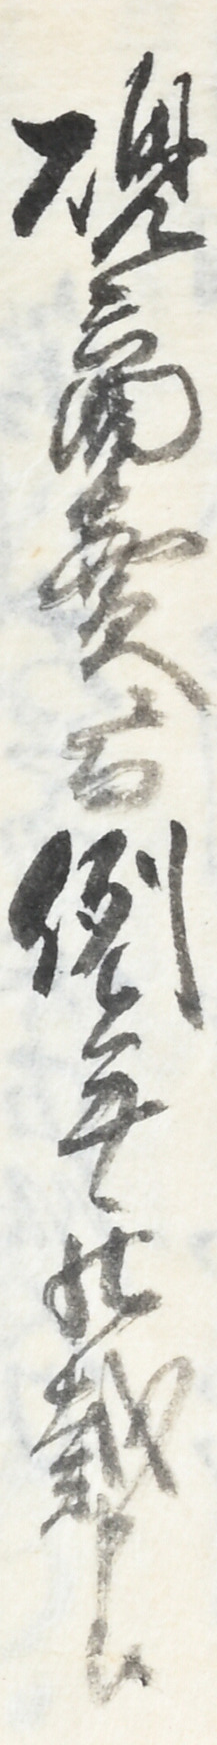綿商売ニ而例年罷越申候

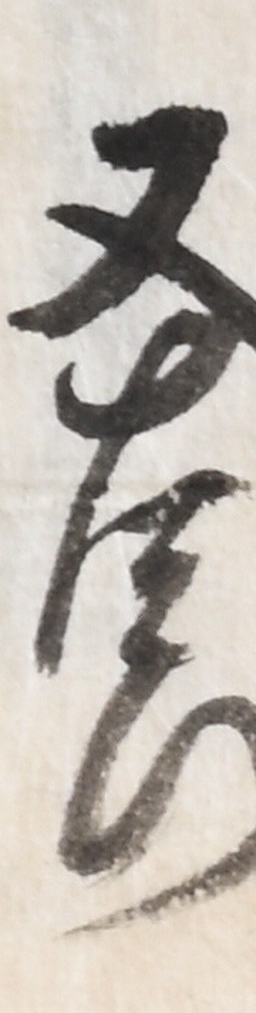吉左衛門
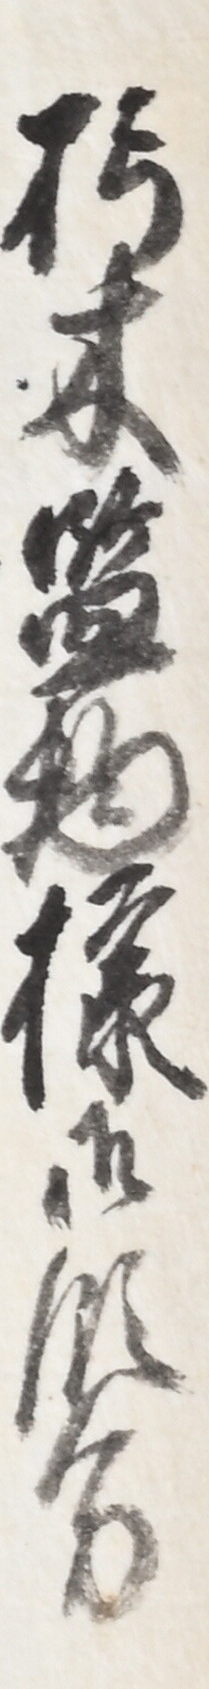朽木監物様御領分
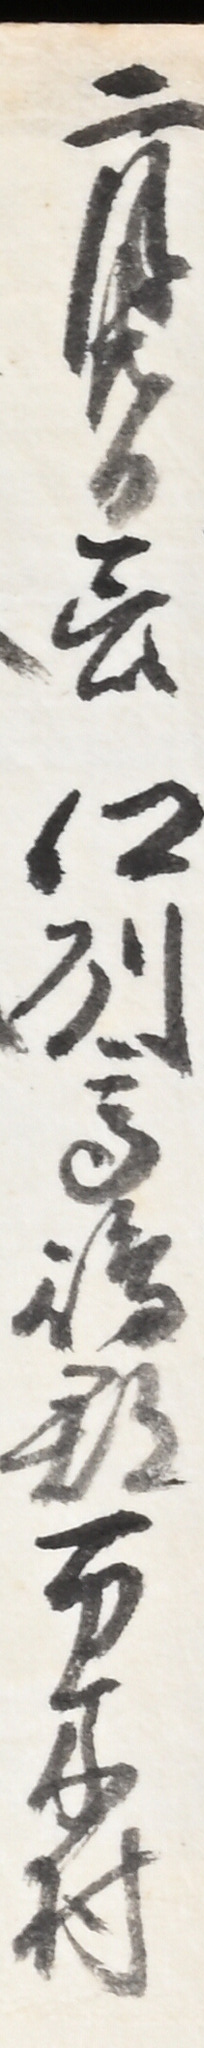二月廿日着江州高嶋郡万木村
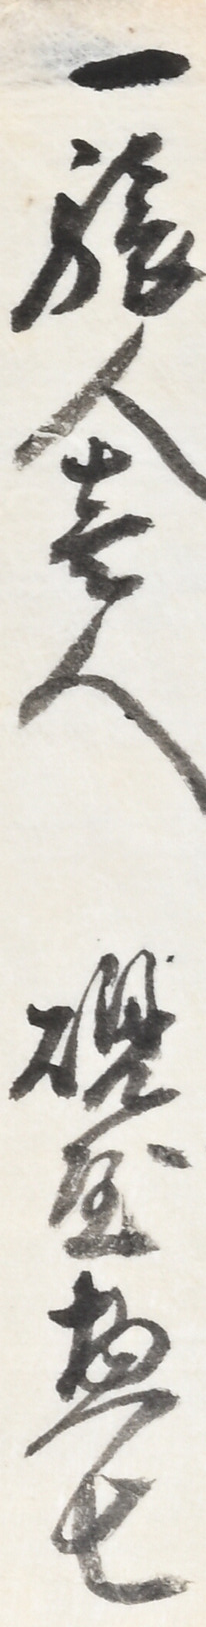一旅人壱人硯屋惣七
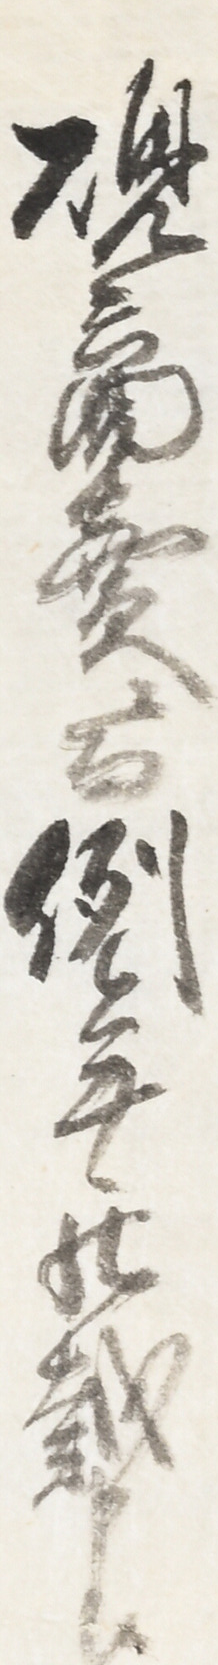硯商売ニ而例年罷越申候
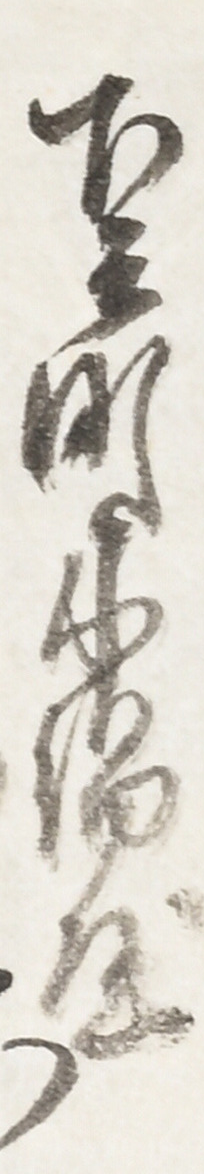下モ町木曽屋
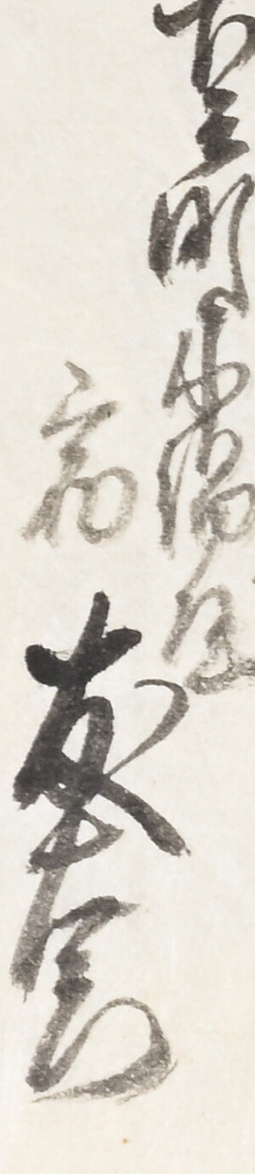宿友右衛門
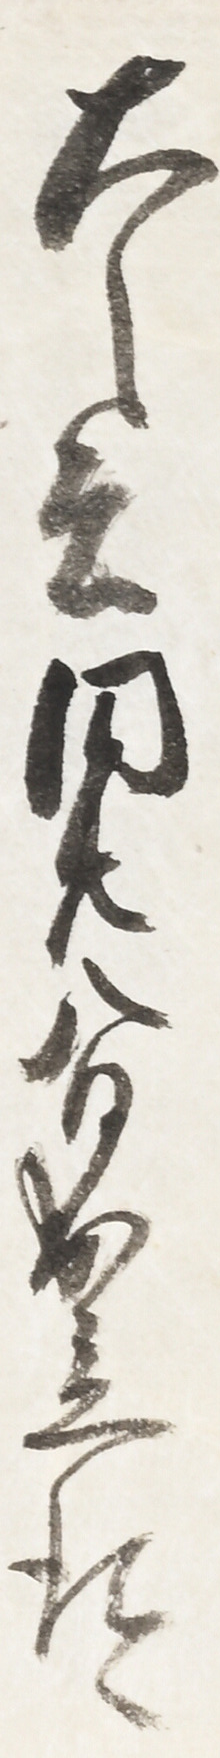右之者同廿八日出立仕候
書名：旅人泊控帳
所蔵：伊那市立高遠町図書館・合同会社AMANE
